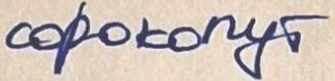сорокопут
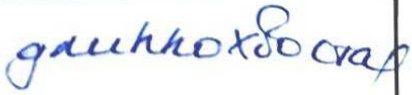длиннохвостая
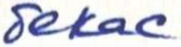бекас
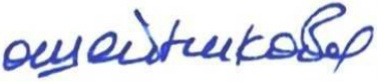ошейниковая
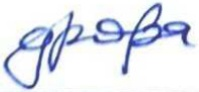дрофа
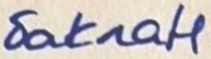баклан
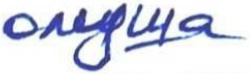олуша
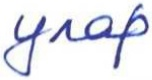улар
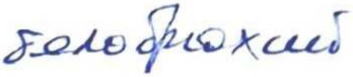белобрюхий
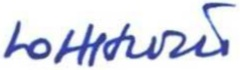южный
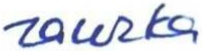гаичка
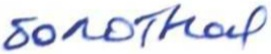болотная
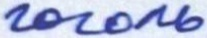гоголь
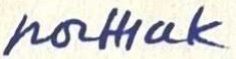пыжик
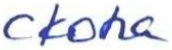скопа
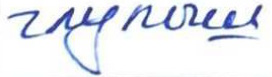глупыш
